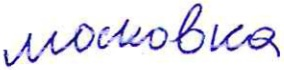московка
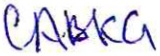савка
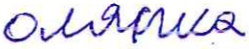оляпка
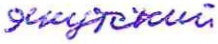якутский
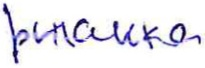ржанка
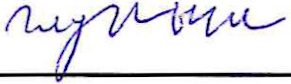глупыш
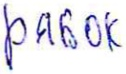рябок
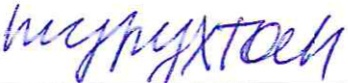турухтан
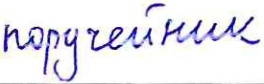поручейник
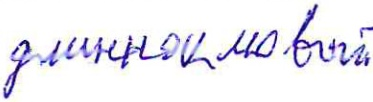длинноклювый
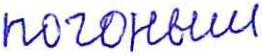погоныш
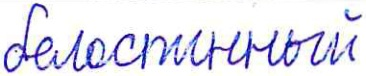белоспинный
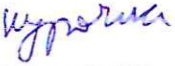курочка
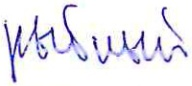рыбный
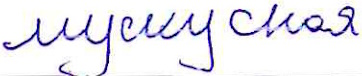мускусная
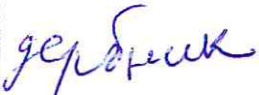дербник
